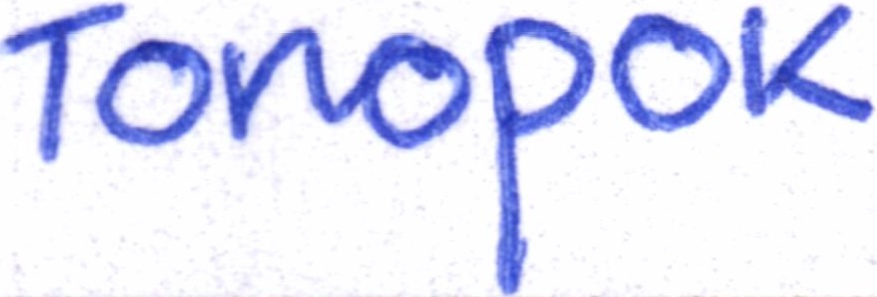топорок
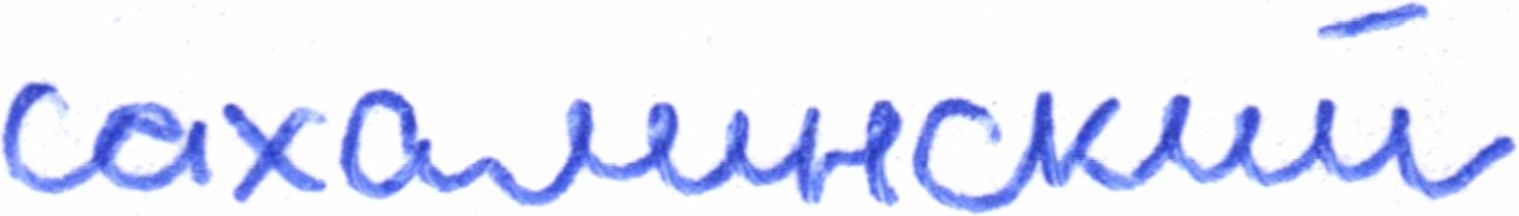сахалинский
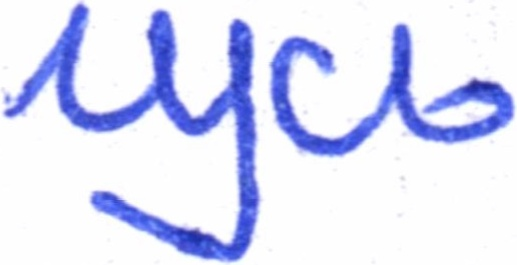гусь
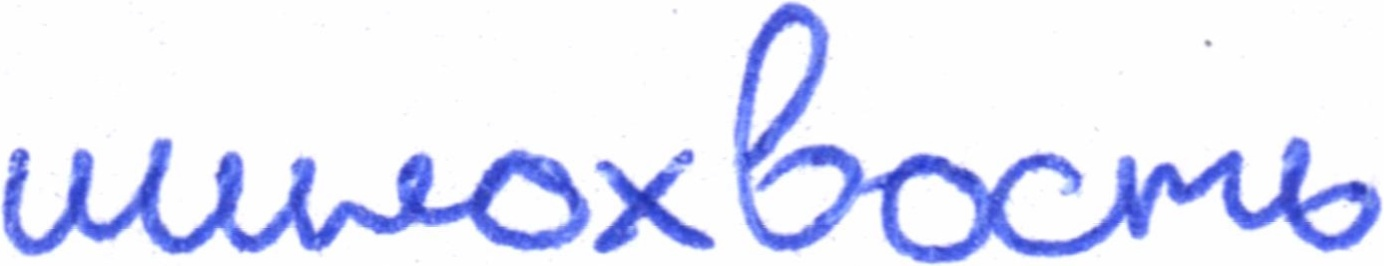шилохвость
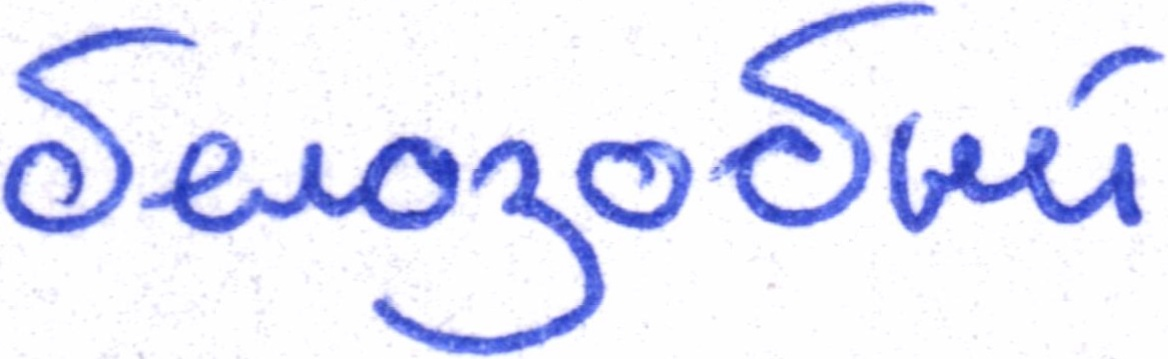белозобый
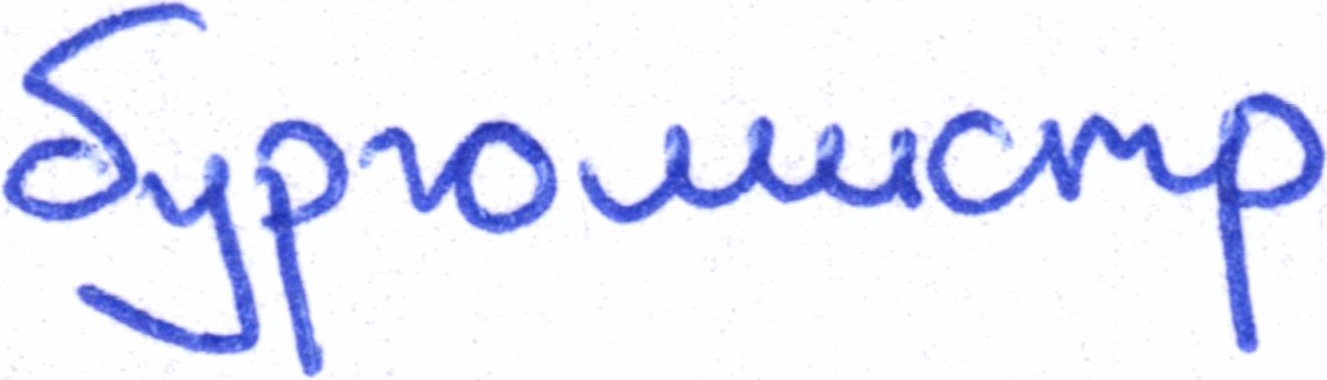бургомистр
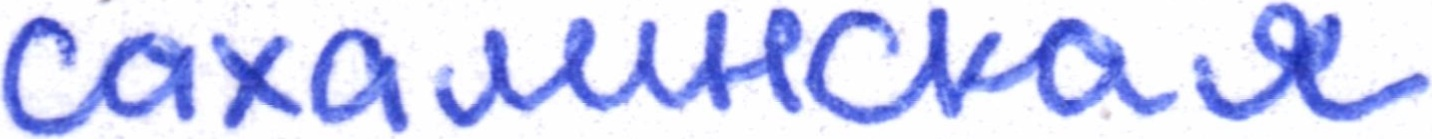сахалинская
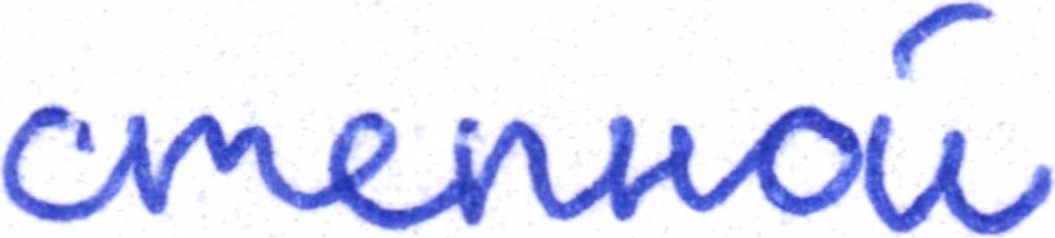степной
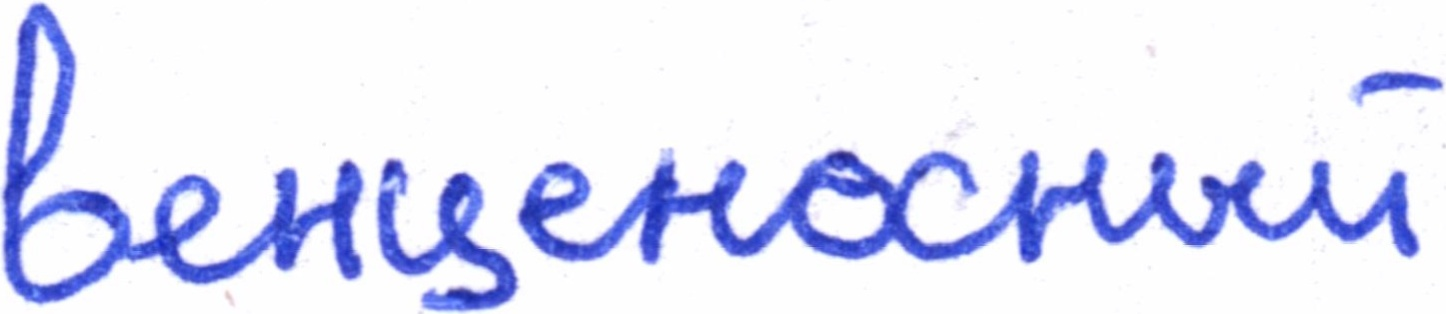венценосный
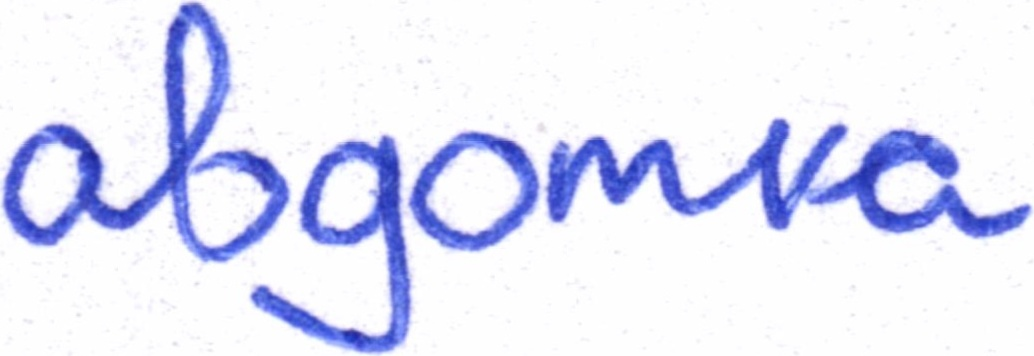авдотка
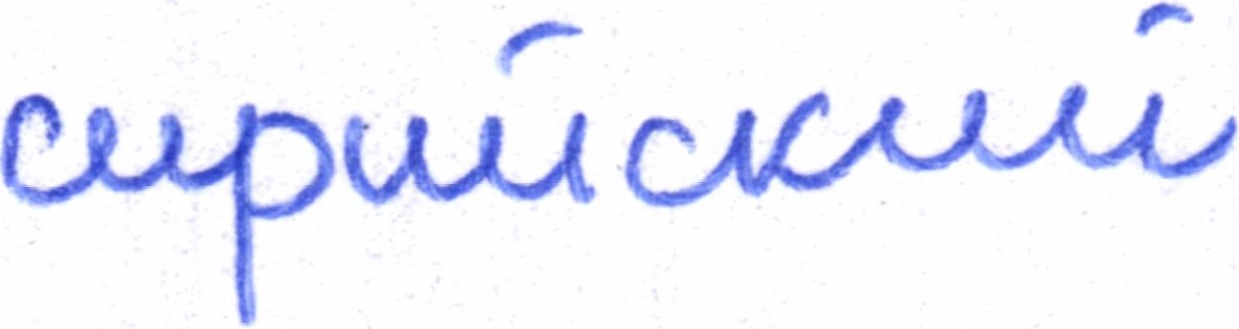сирийский
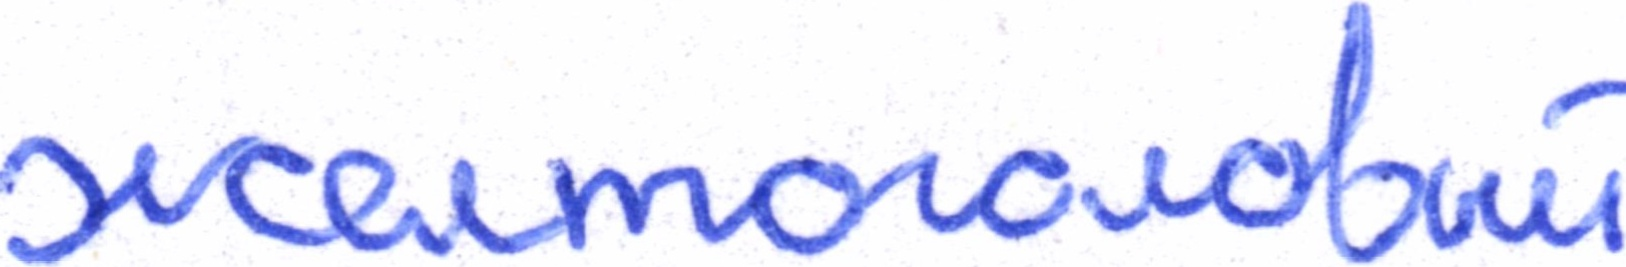желтоголовый
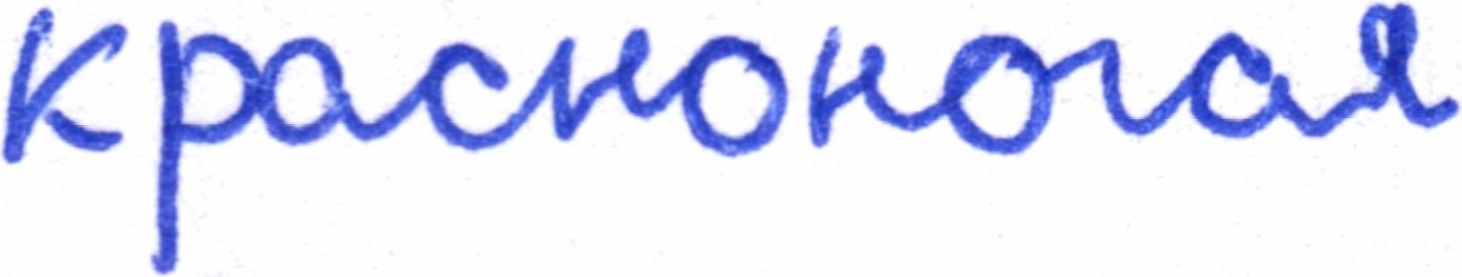красноногая
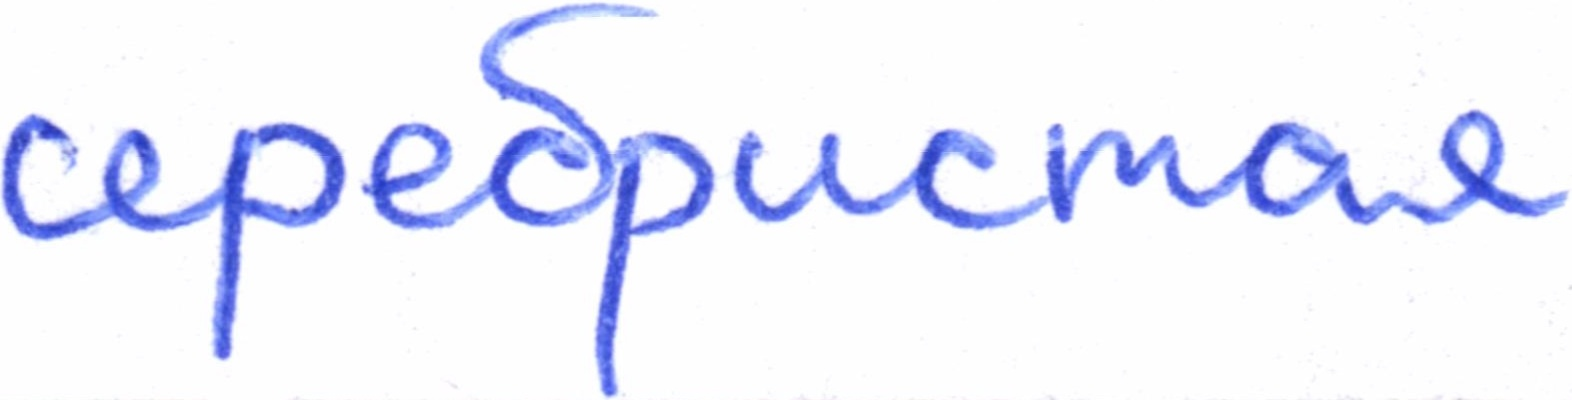серебристая
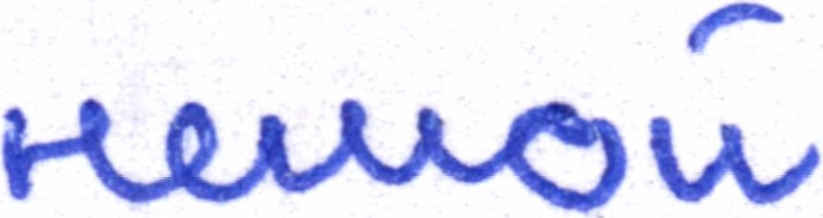немой
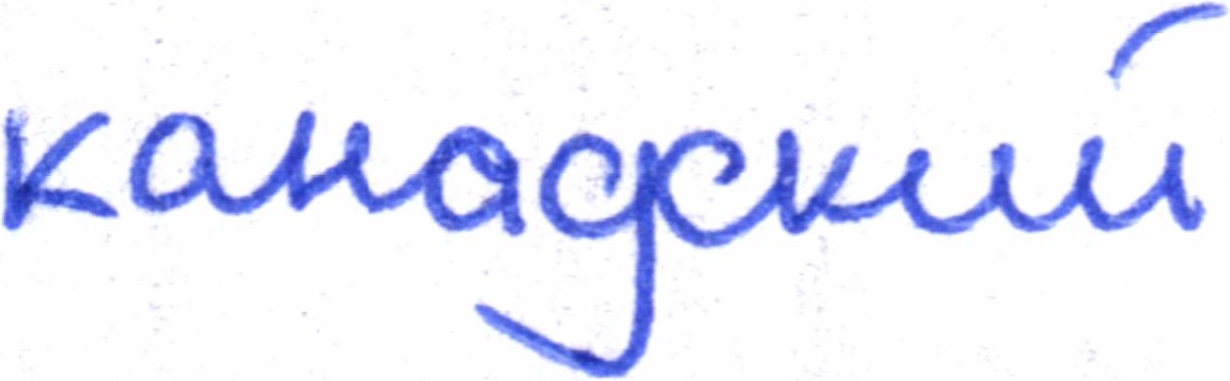канадский
